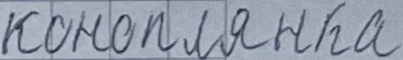коноплянка
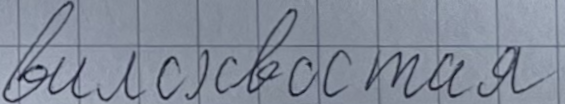вилохвостая
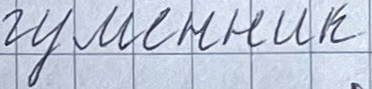гуменник
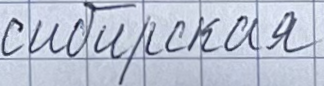сибирская
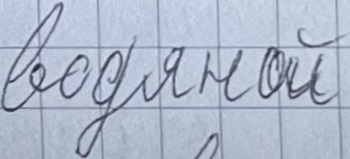водяной
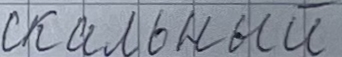скальный
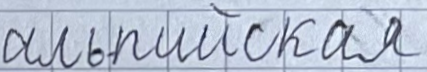альпийская
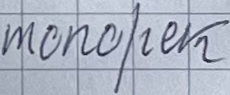топорок
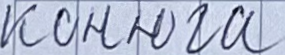конюга
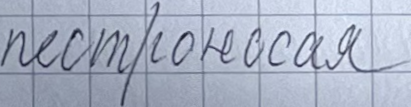пестроносая
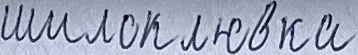шилоклювка
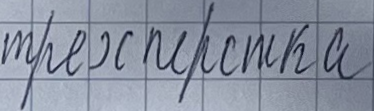трехперстка
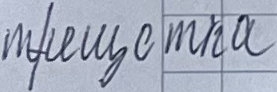трещотка
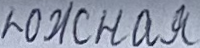южная
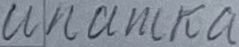ипатка
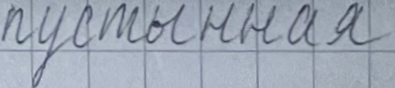пустынная
